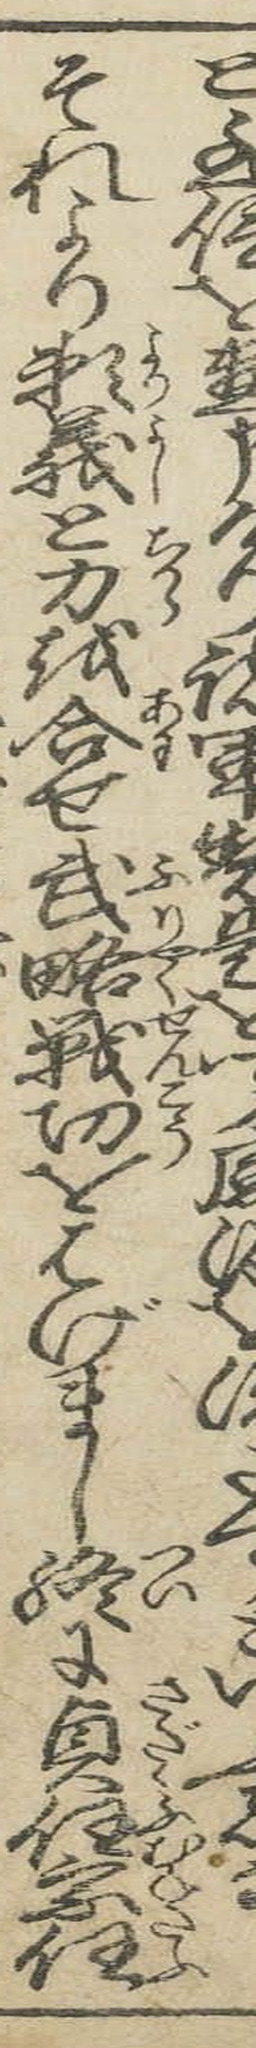それより頼義と力を合せ武略戦功をはげまし終に貞任宗任
